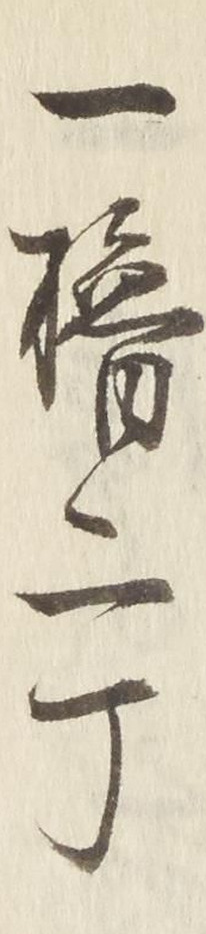一櫓二丁
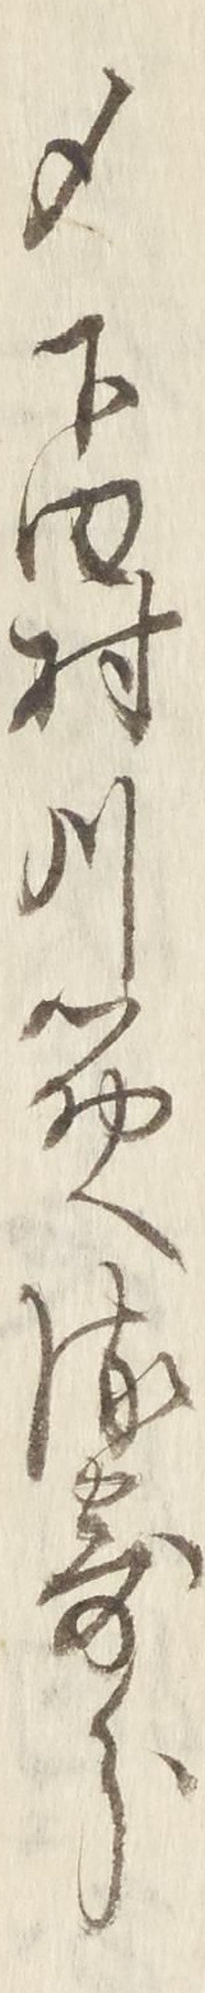〆下田村川筋へ流寄分
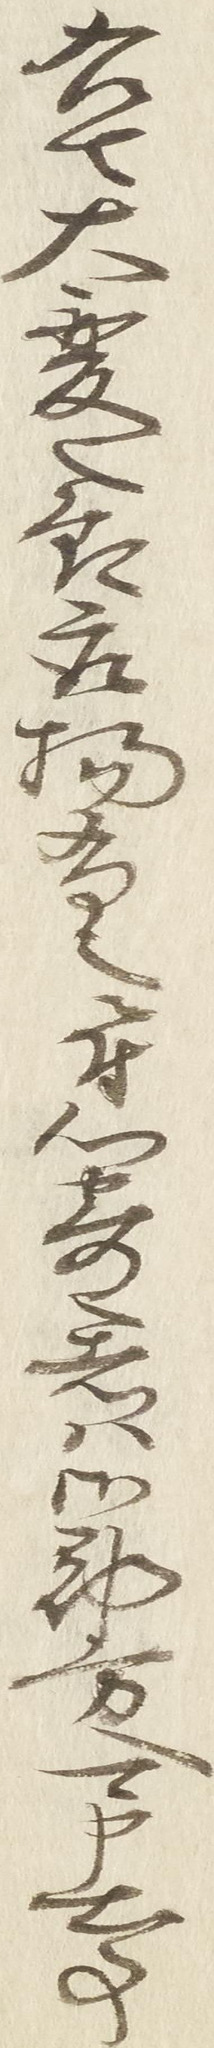右は大変之節取物有之二付心寄候者は御郡方へ可申出事
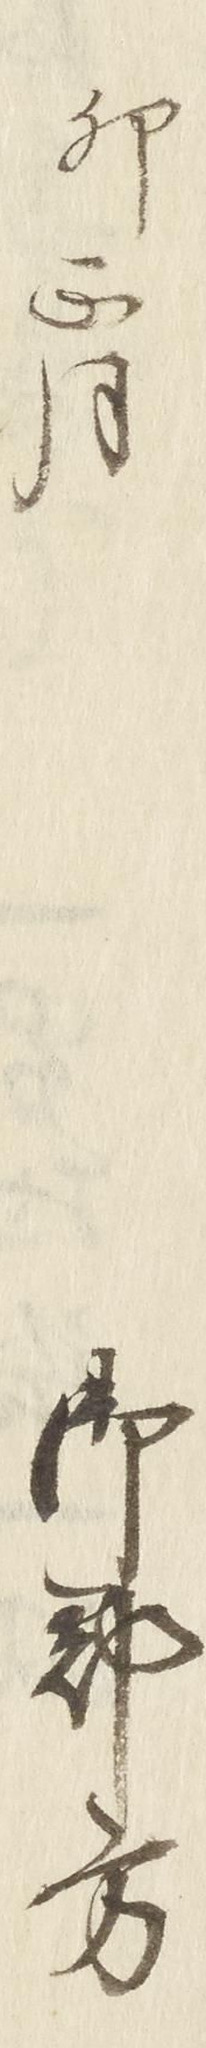卯正月御郡方
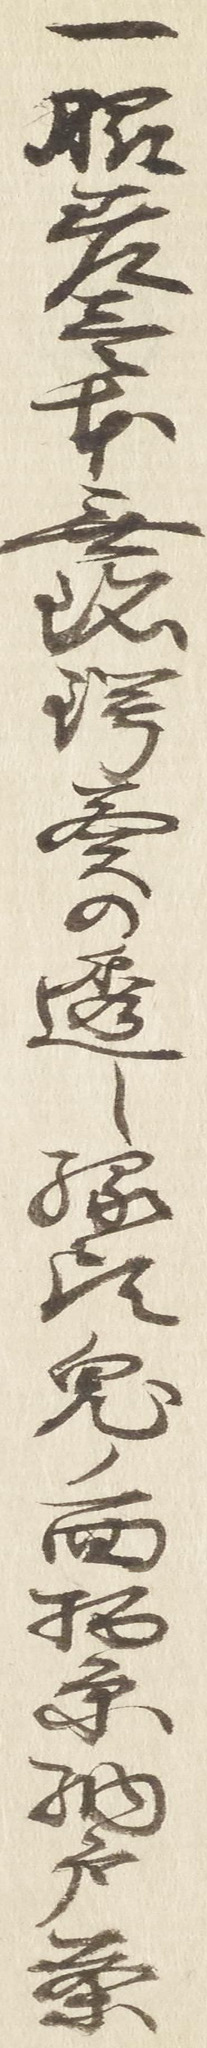一脇差壱本無銘鍔葵の透し縁頭鬼ノ面柄糸納戸茶
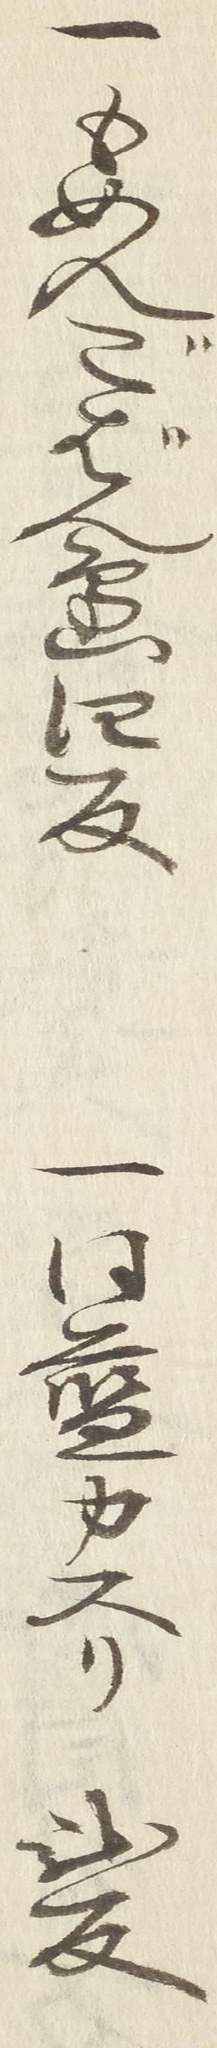一もめんごばん画四反一同藍カスリ弐反
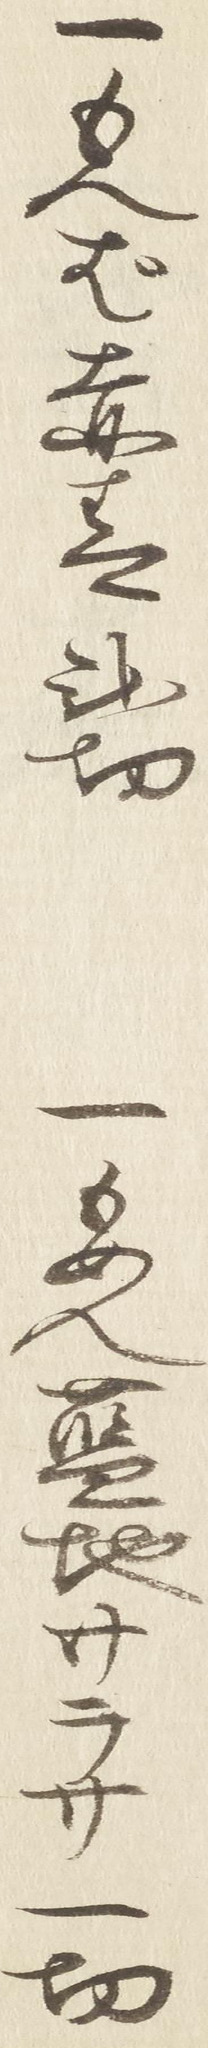一もんば赤青弐切一もめん藍地サラサ一切
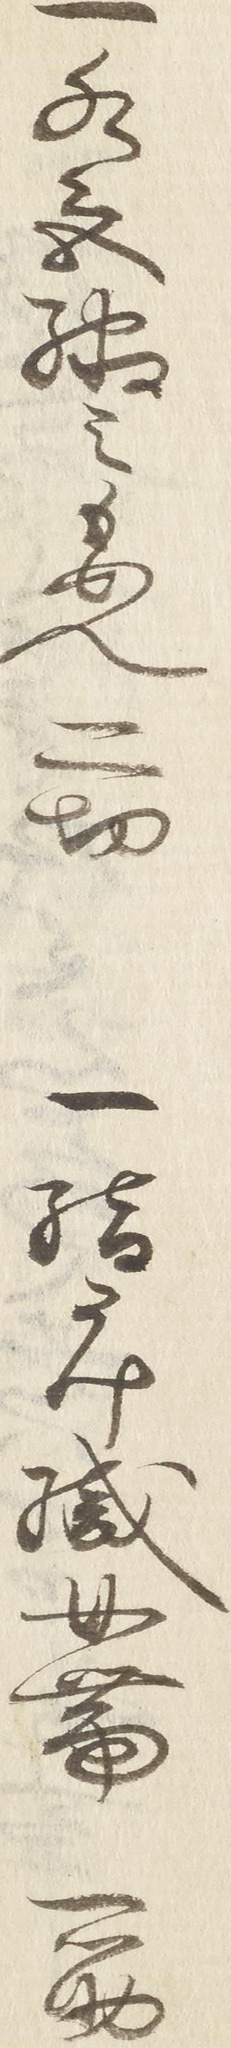一水色綿之もめん二切一絹かけ織女帯一筋
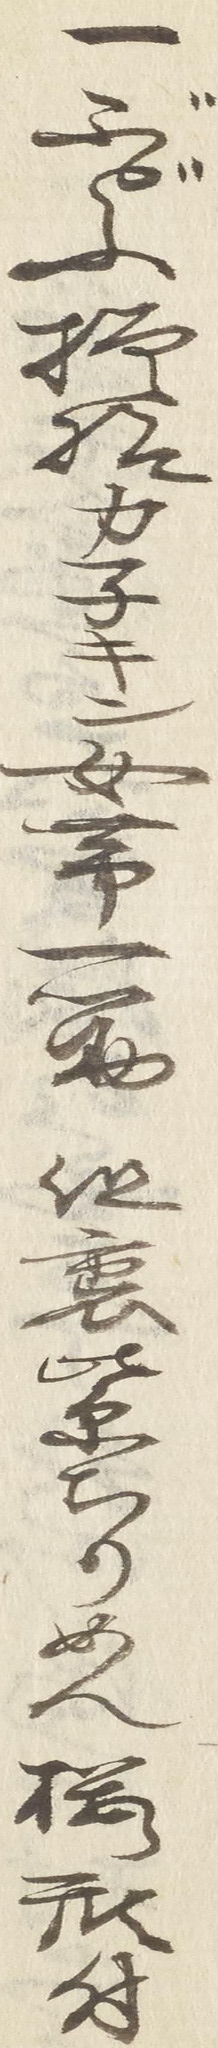一ぶどふ模様カ子キン女帯一筋但裏紫ちりめん桜形付
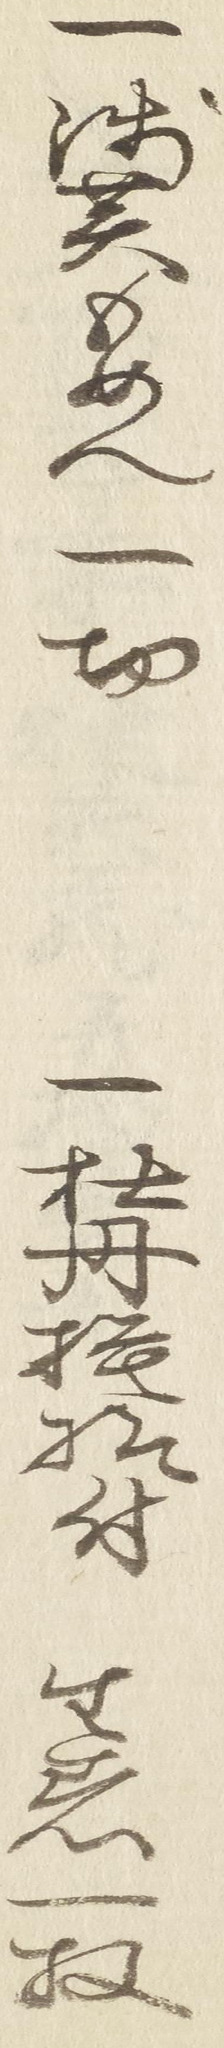一浅黄もめん一切一牡丹模様付生着一枚
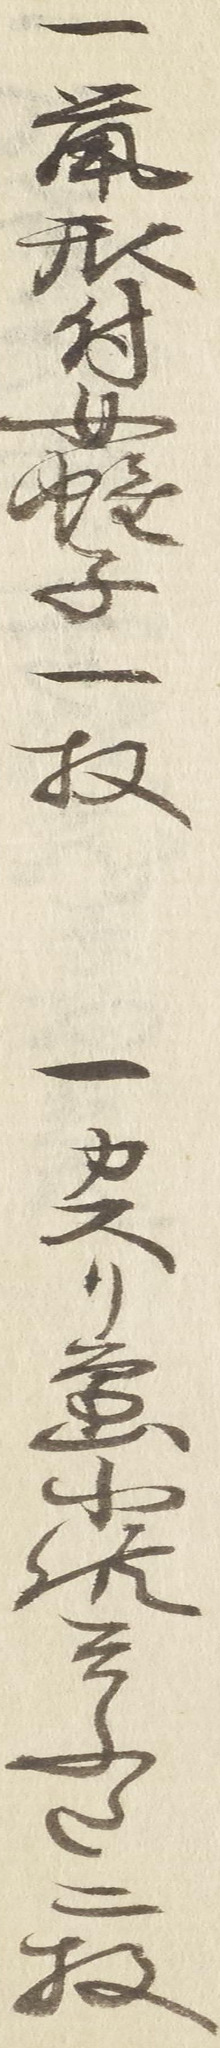一鼠形付女帷子一枚一カスリ画子供そうた二枚
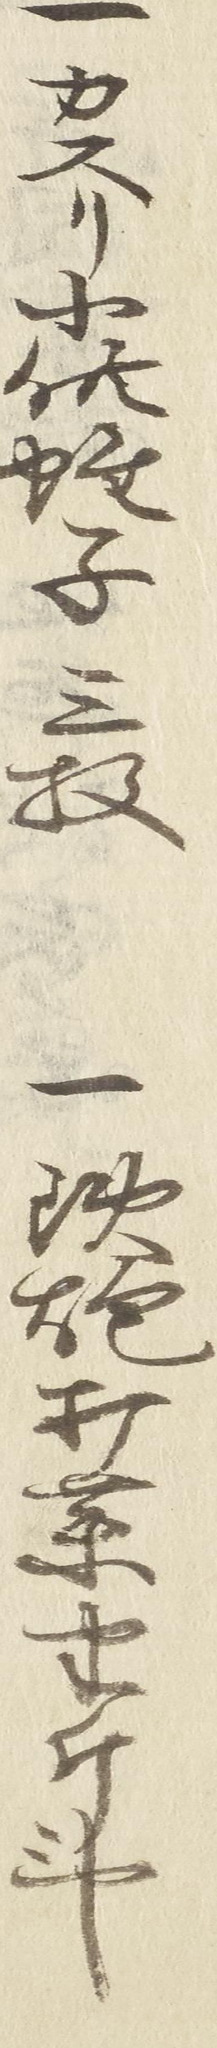一カスリ子供帷子三枚一鉄炮打薬半斤斗

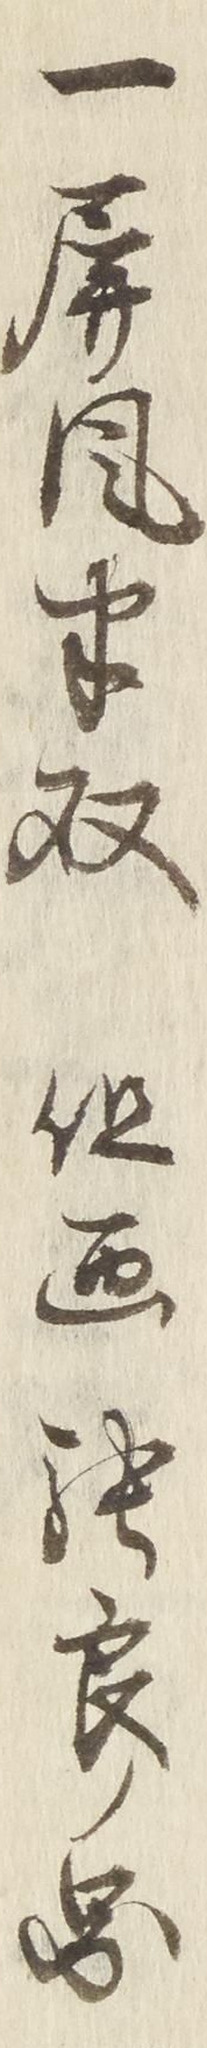一屏風半双但画張良の圖
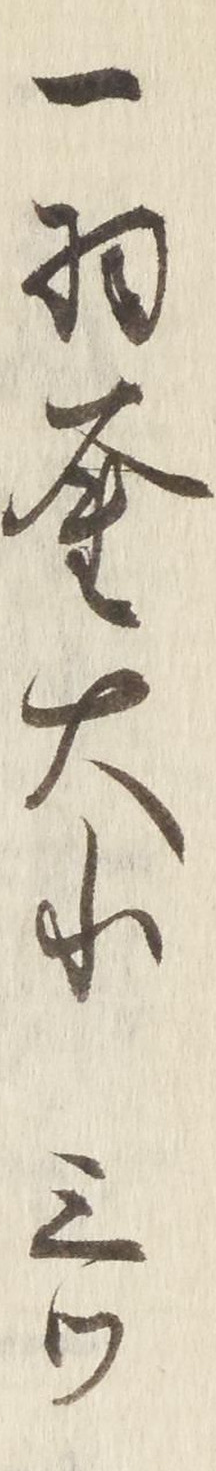一羽釜大小三ッ
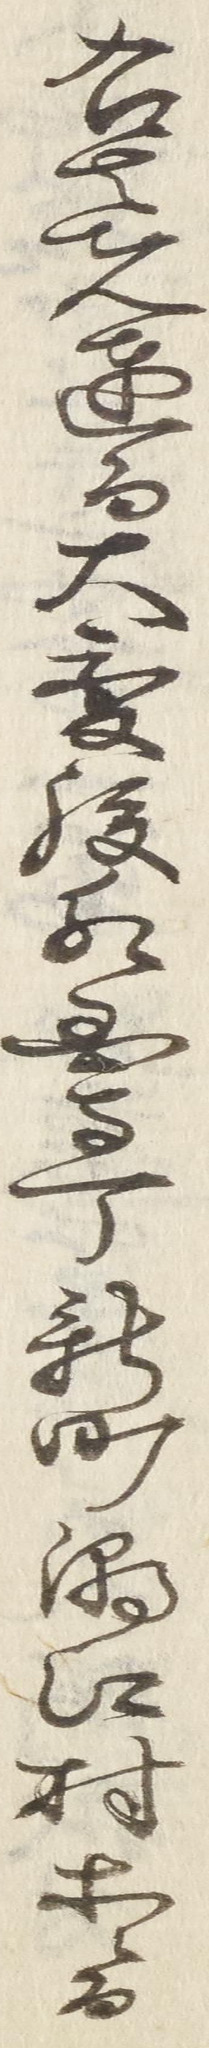右は先達而大震後永国寺丁新町潮江村等二而
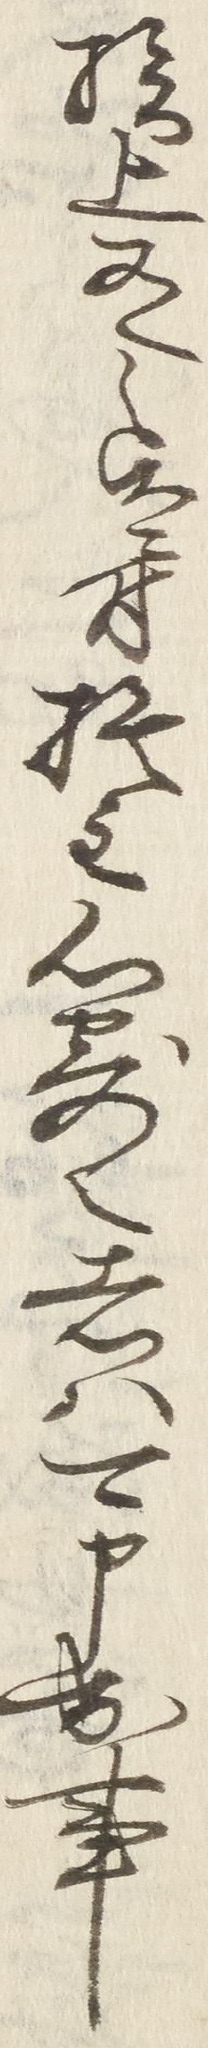拾上有之候に付捨主心寄之者は可申出事
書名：地震記　下
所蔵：東京大学地震研究所図書室 Earthquake Research Institute Library, The University of Tokyo, JAPAN
